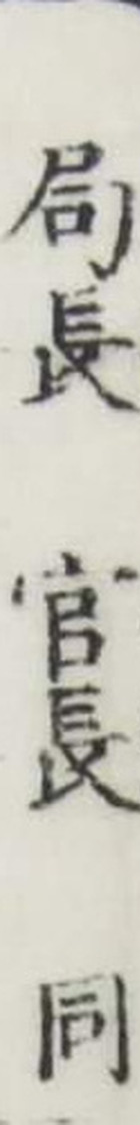局長官長同
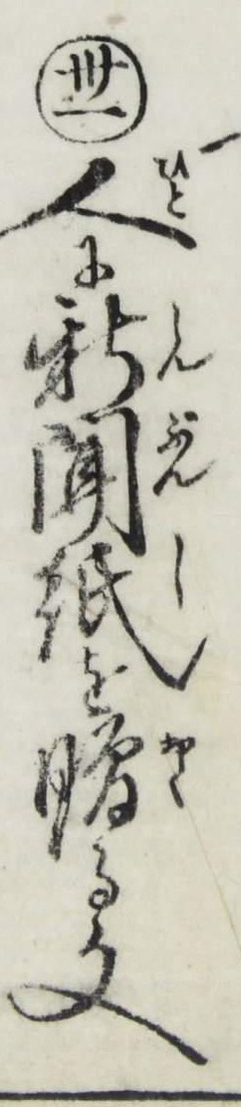丗一人に新聞紙を贈る文
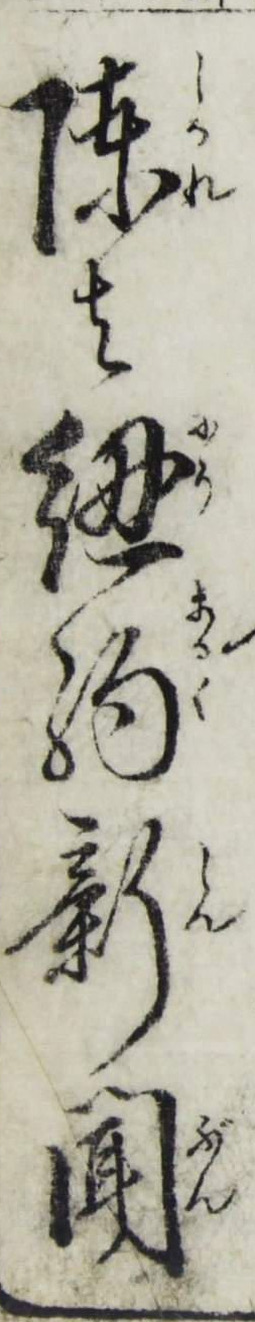陳は紐約新聞

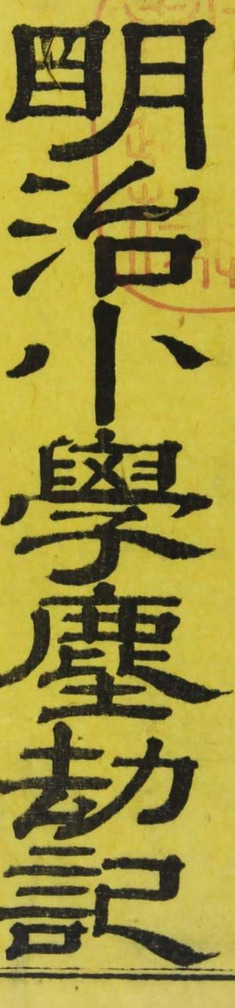明治小学塵劫記
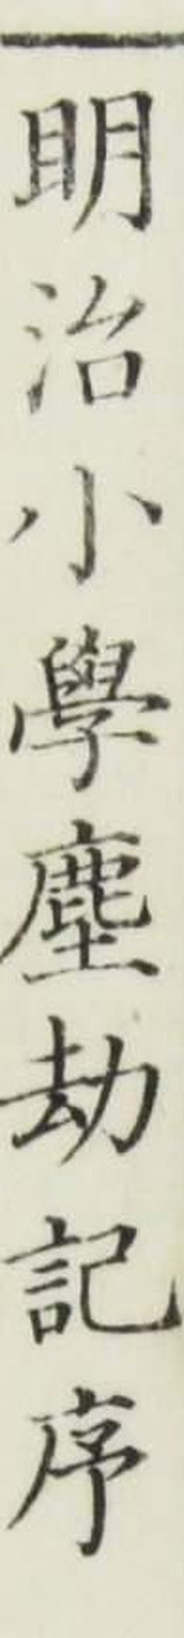明治小学塵劫記序
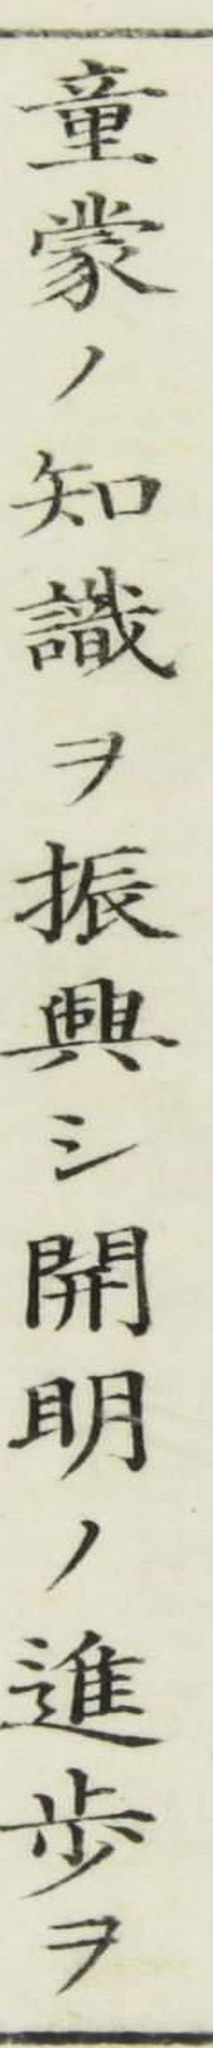童蒙ノ知識ヲ振興シ開明ノ進歩ヲ
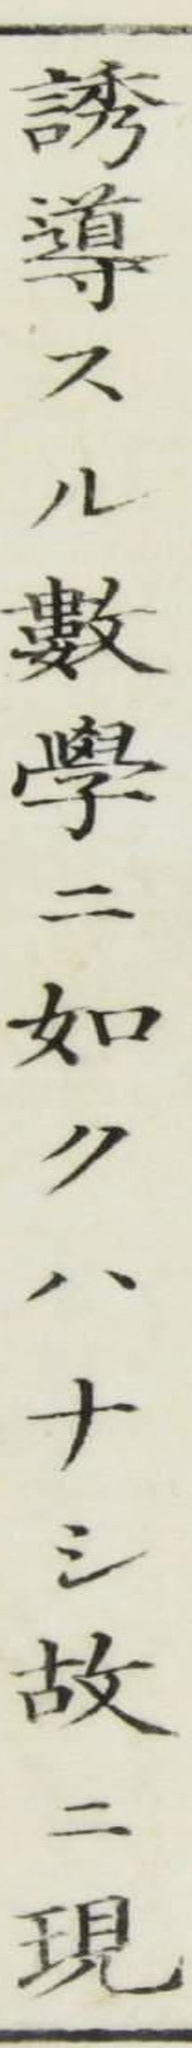誘導スル数学ニ如クハナシ故ニ現
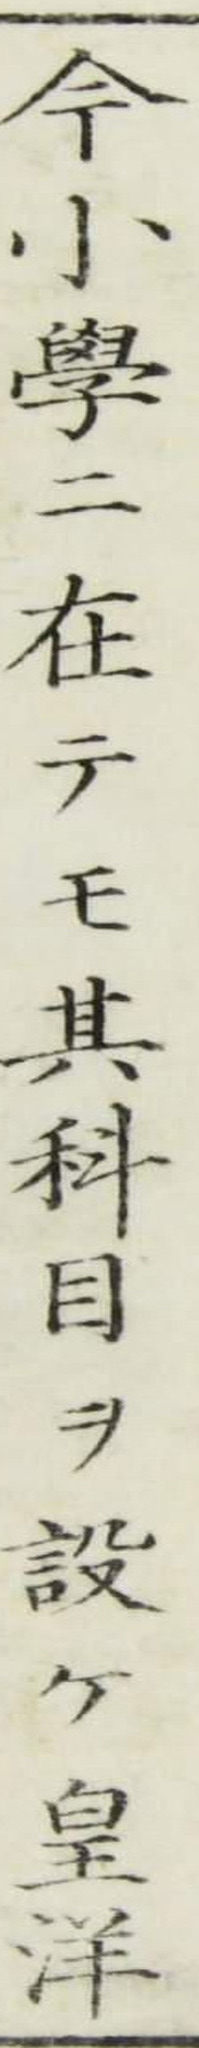今小学ニ在テモ其科目ヲ設ケ皇洋
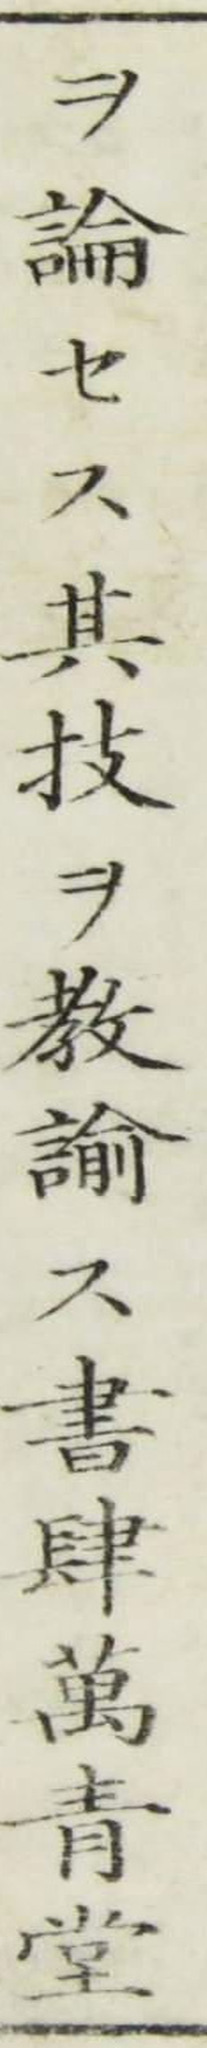ヲ論セス其技ヲ教諭ス書肆万青堂
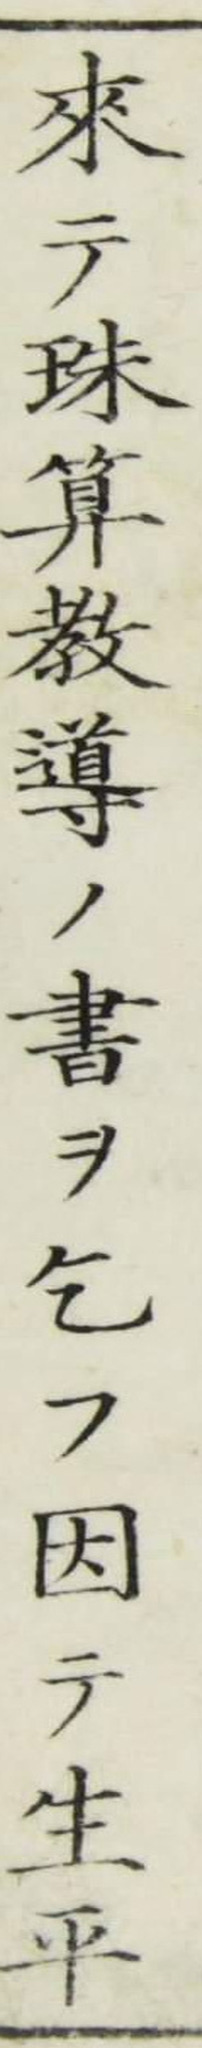来テ珠算教導ノ書ヲ乞フ因テ生平
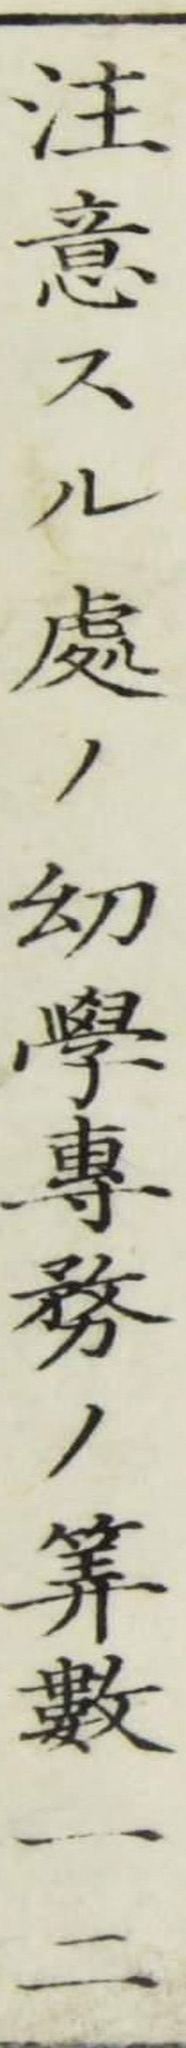注意スル処ノ幼学専務ノ算数一二
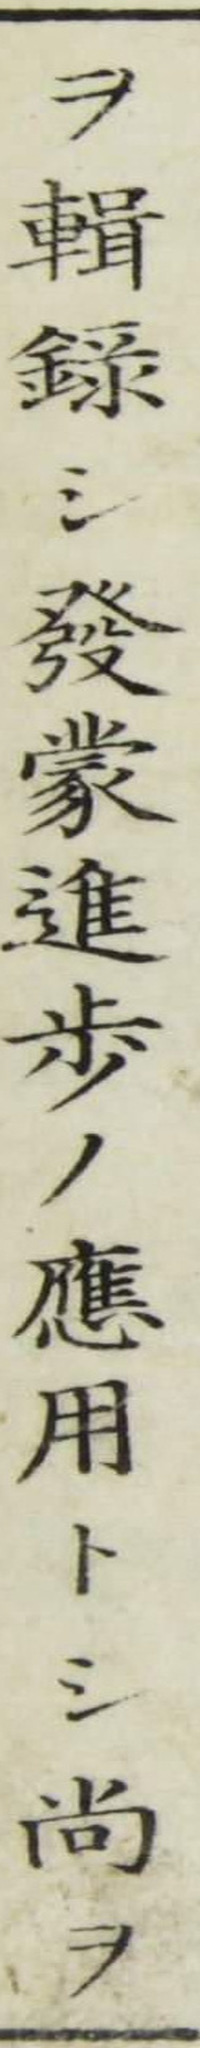ヲ輯録シ発蒙進歩ノ応用トシ尚ヲ

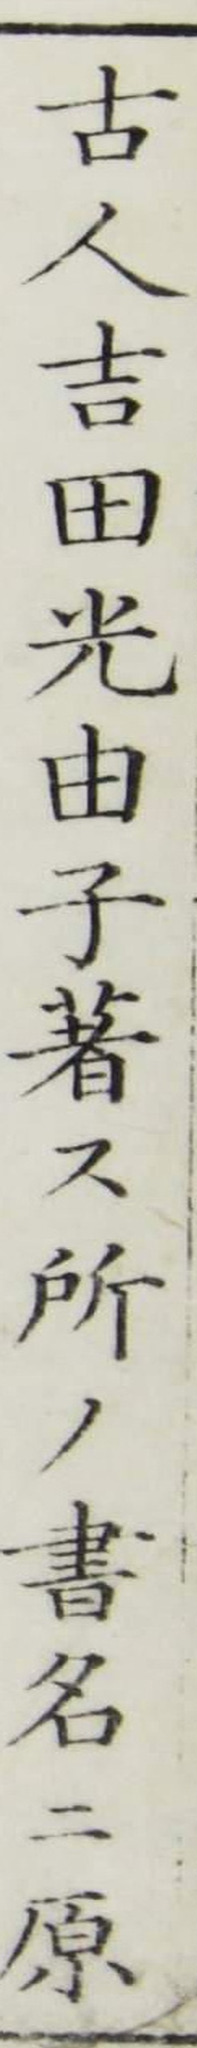古人吉田光由子著ス所ノ書名ニ原
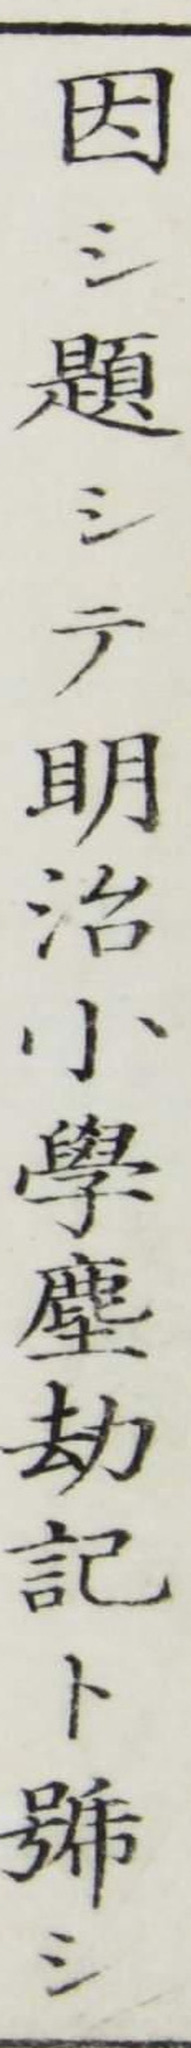因シ題シテ明治小学塵劫記ト号シ
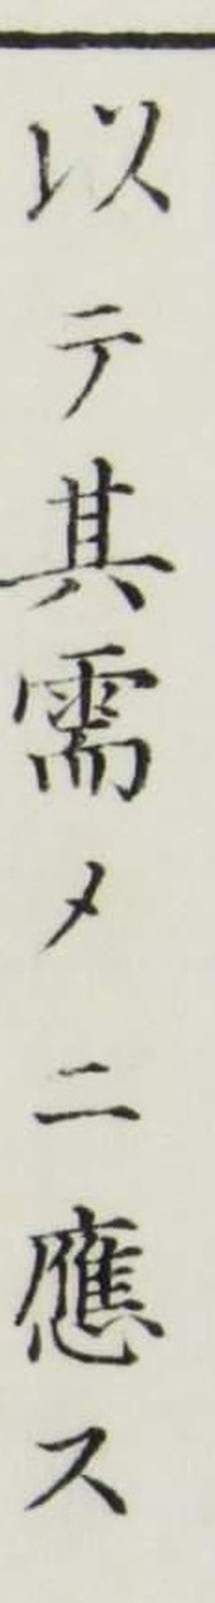以テ其需メニ応ス
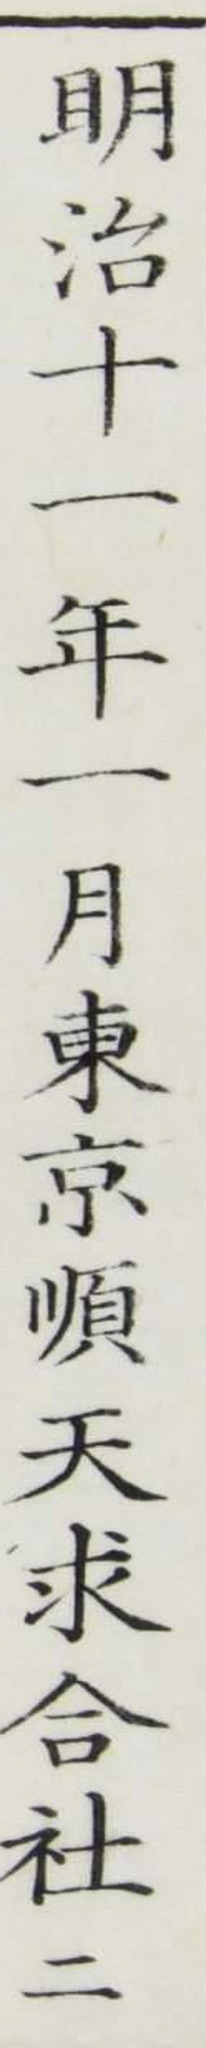明治十一年一月東京順天求合社ニ
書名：明治小學塵劫記 卷1
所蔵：東京学芸大学教育コンテンツアーカイブ
